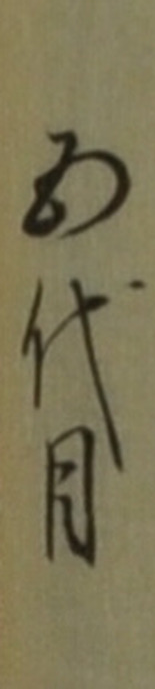五代目
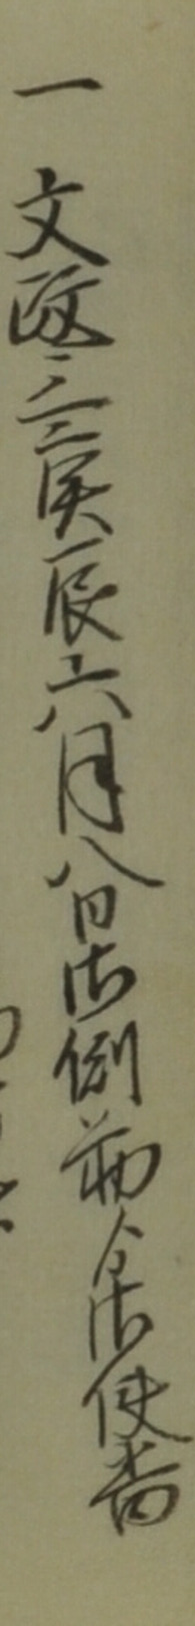一文政三庚辰六月八日御側勤ゟ御使番
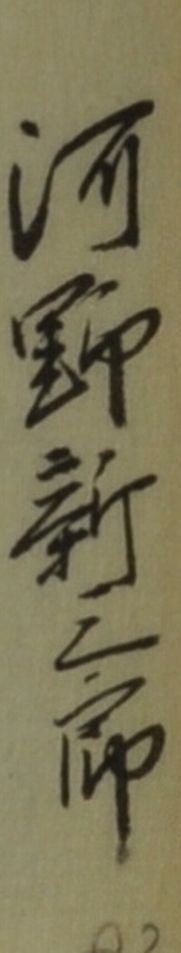河野新三郎
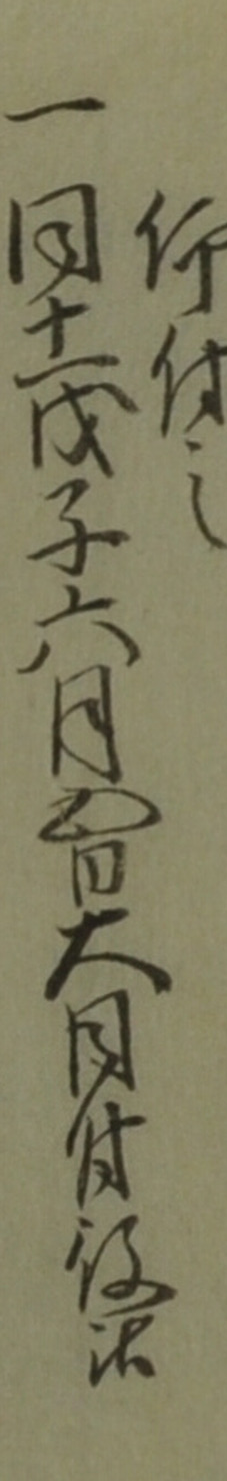一同十一戊子六月五日大目付役被
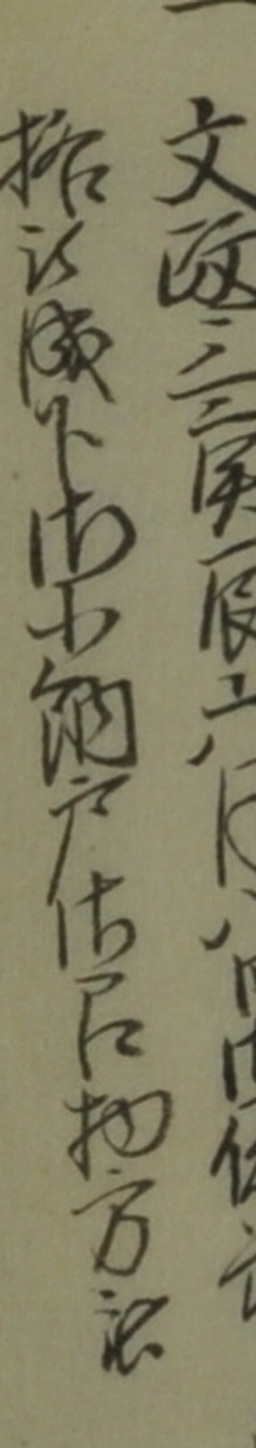格被成下御小納戸御召物方被
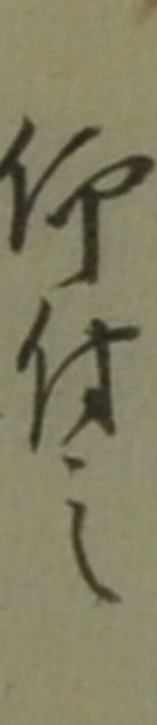仰付之
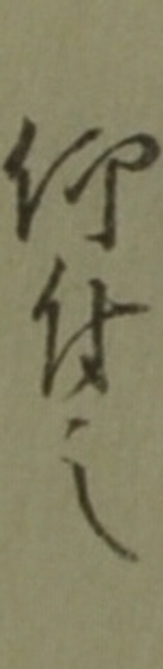仰付之
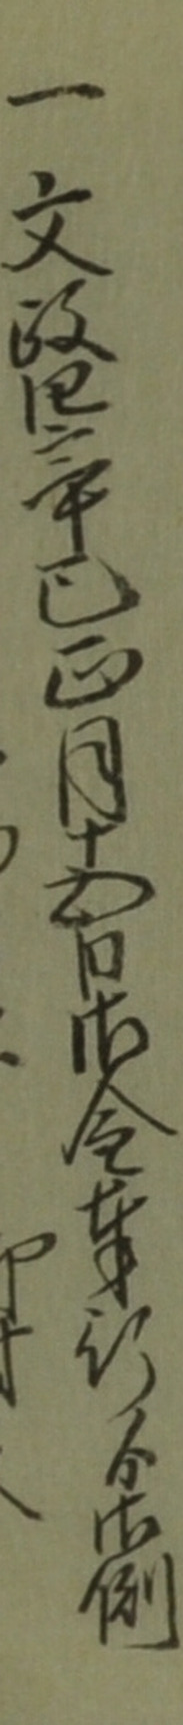一文政四辛巳正月十五日御金奉行ゟ御側
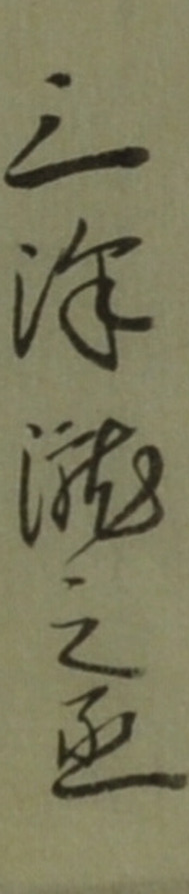三沢瀧之丞
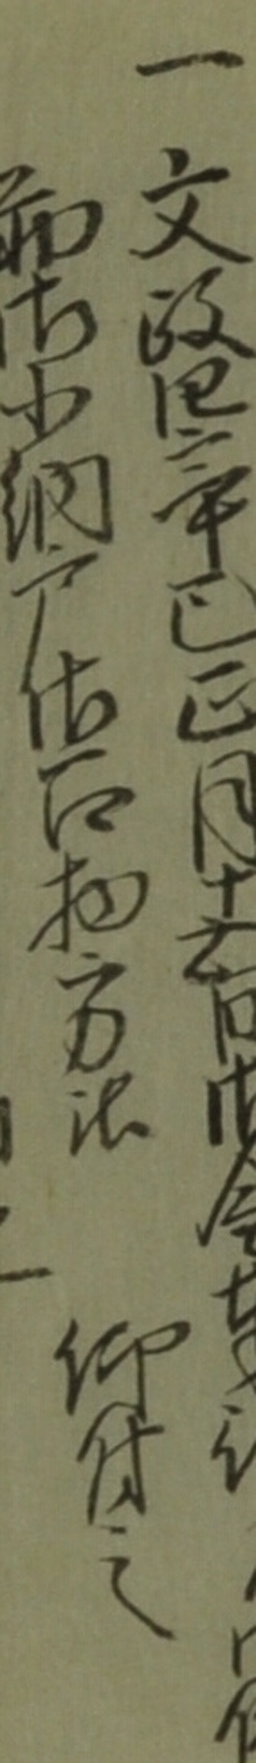勤御小納戸御召物方被仰付之
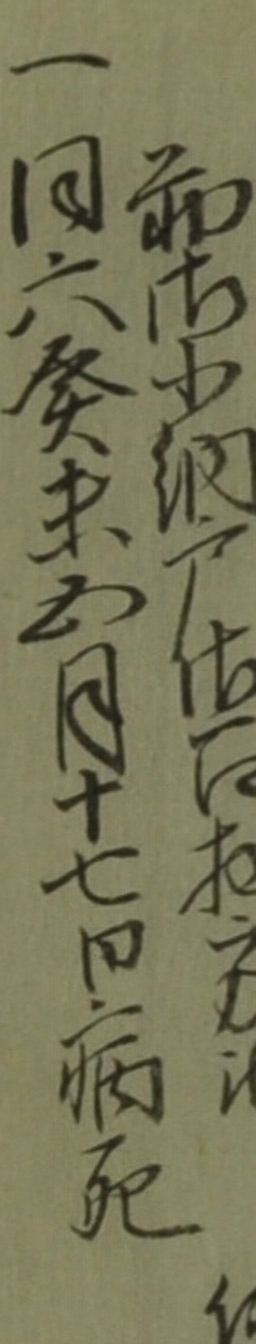一同六癸未五月十七日病死
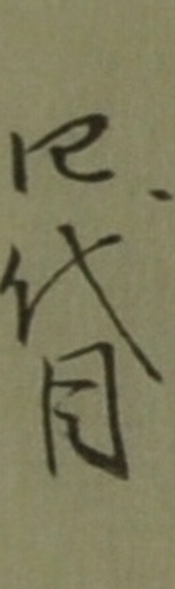四代目
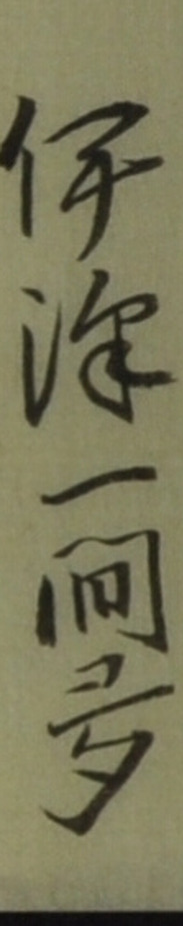伊沢一間多

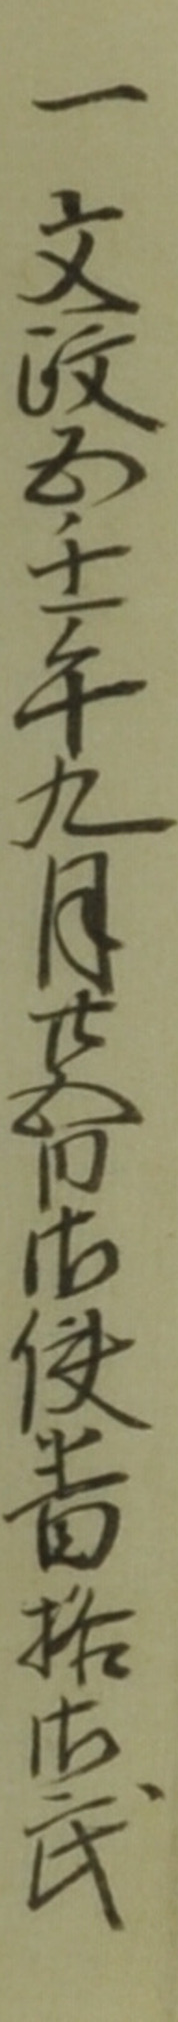一文政五壬午九月廿五日御使番格御武
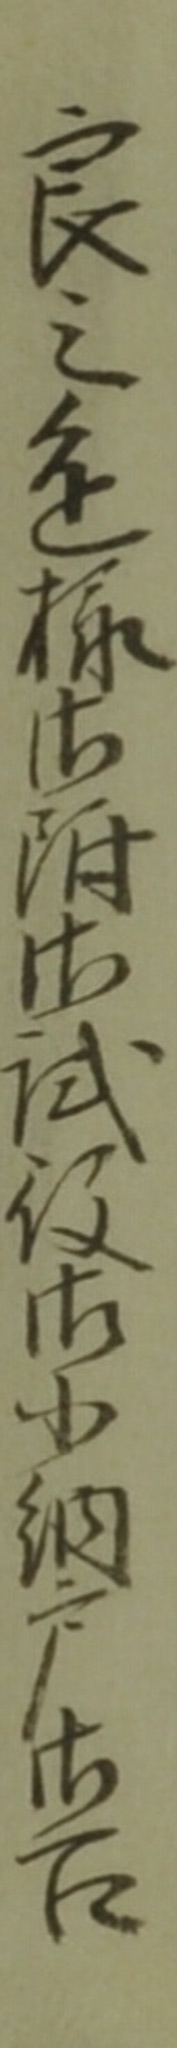良之進様御附御試役御小納戸御召
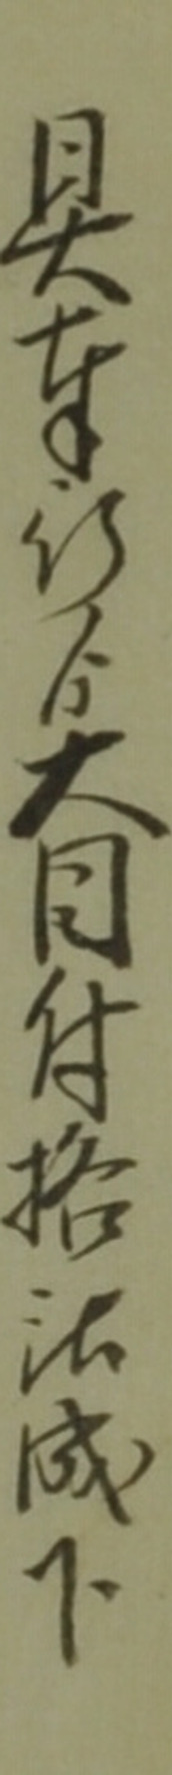具奉行ゟ御目付格被成下
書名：諸御役代々録（四）
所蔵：伊那市立高遠町図書館・合同会社AMANE
